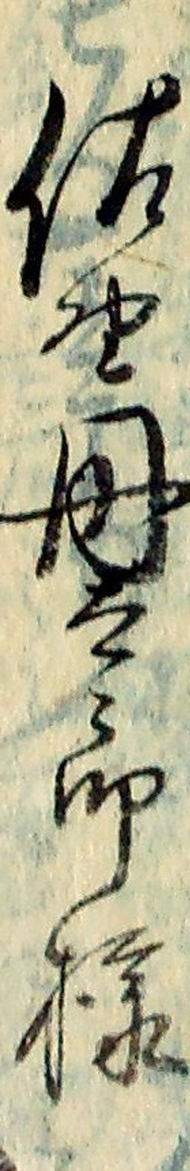佐野丹太郎様
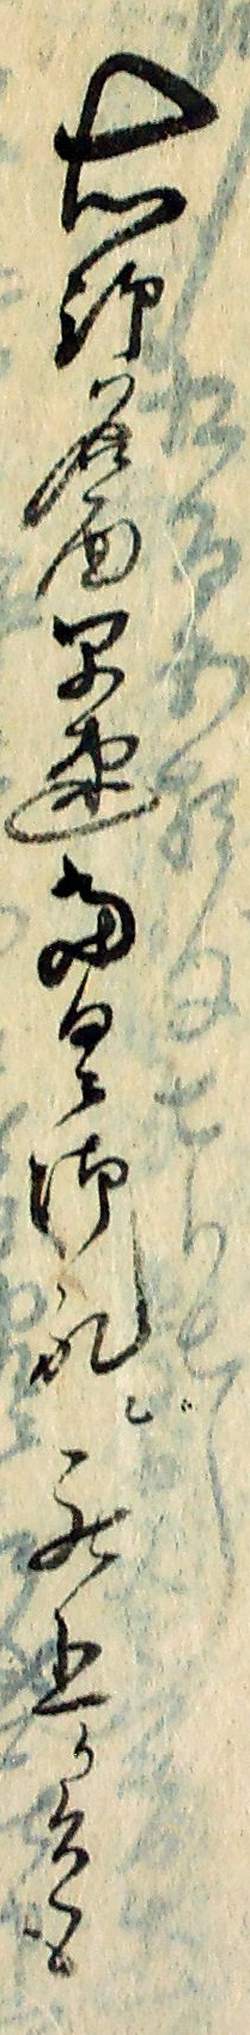右御名面早速当日に御礼に罷上り候以上
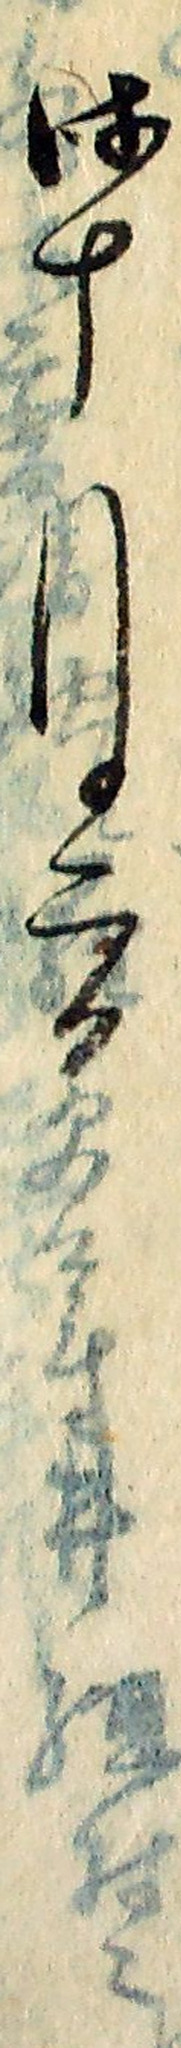戌十月二日

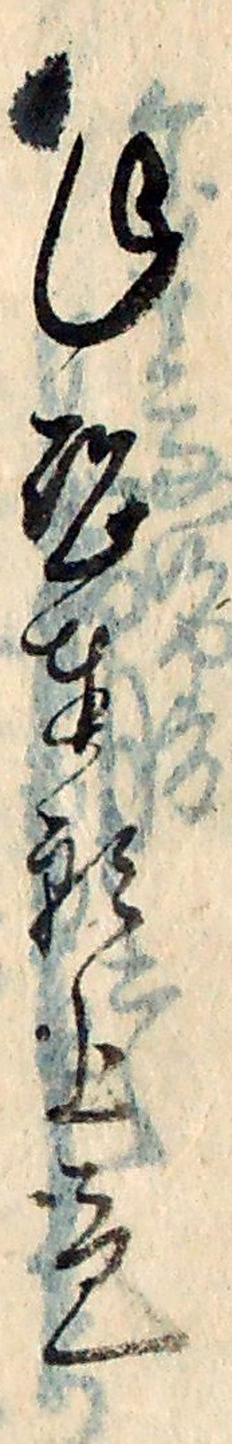乍恐奉願上覚
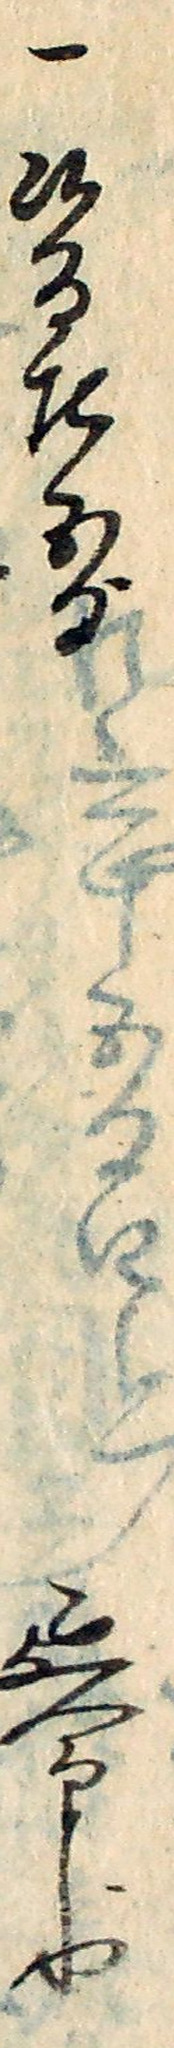一弐百廿五匁延命村
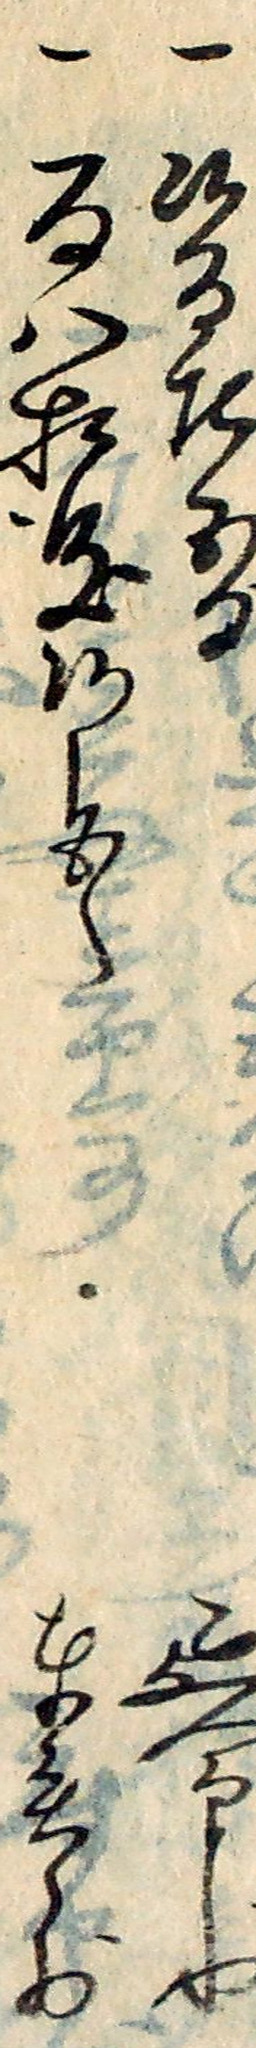一百八拾弐匁弐分五厘東矢ノ村
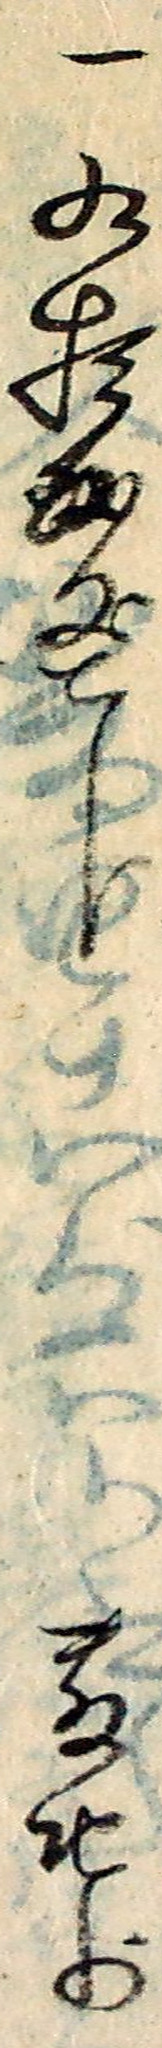一九拾弐匁七分敷地村
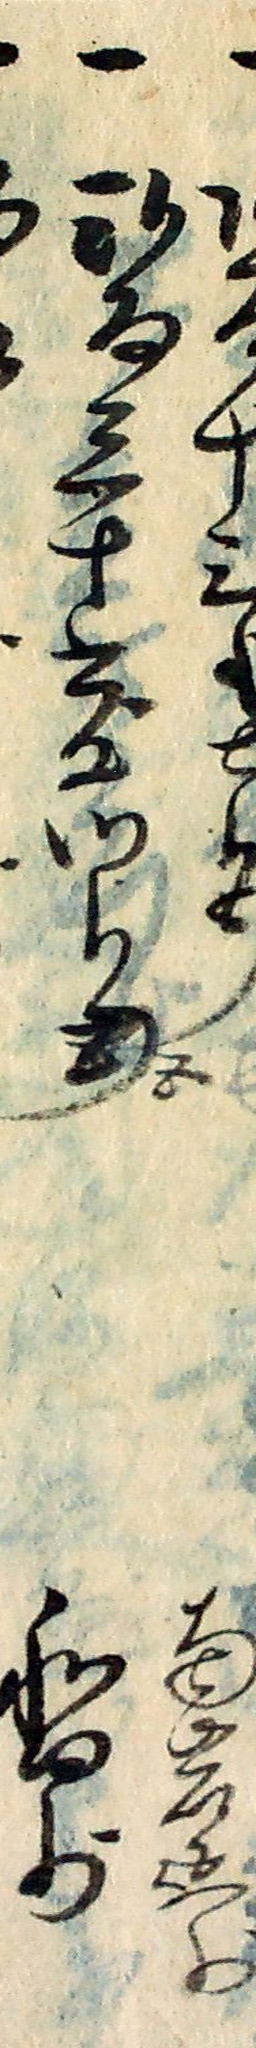一弐百三十六匁弐分五厘和田村
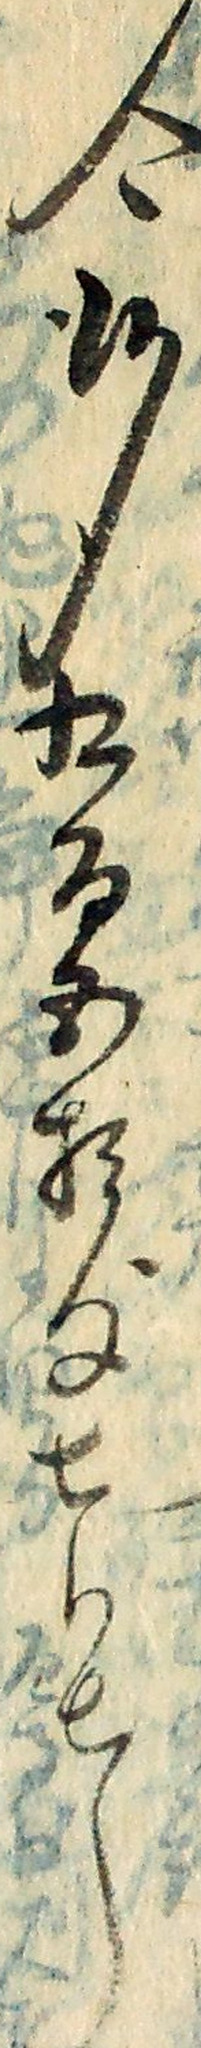合弐貫九百五拾匁七分七厘
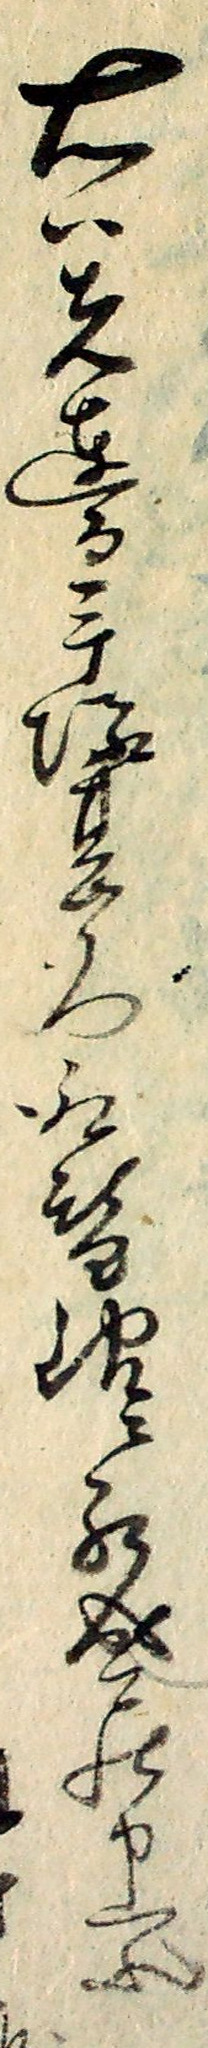右は先達て手塚甚右衛門取替銀に罷成居申所
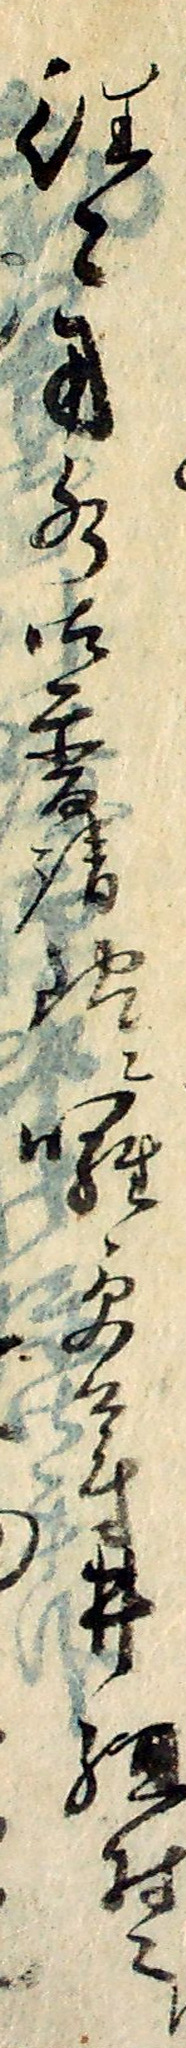往々用水御普請銀に囉受候に付井組村々え
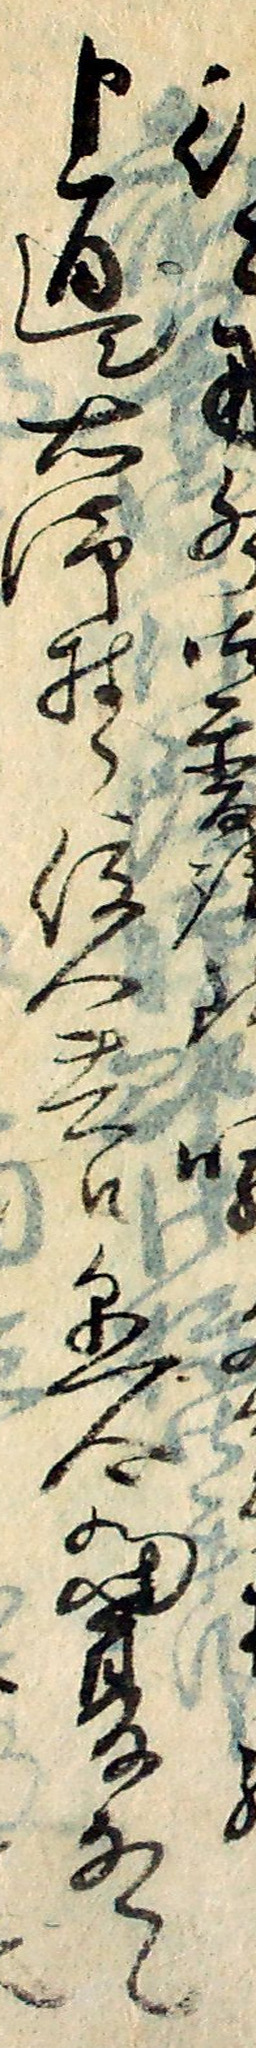申通し右滞村々へ役人共え懸合当夏冬
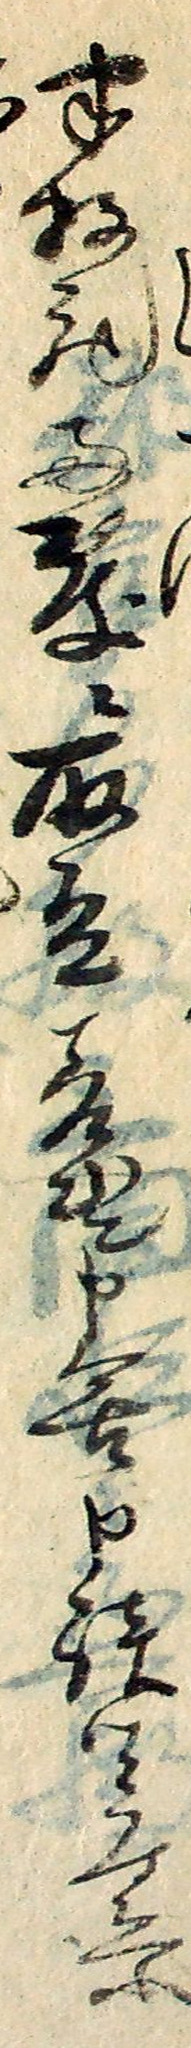半数宛両度に取立差出し申筈申談御座候所
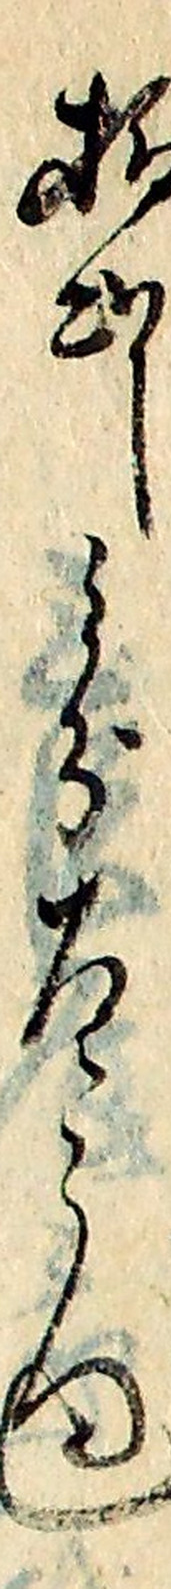指出し之分左之通

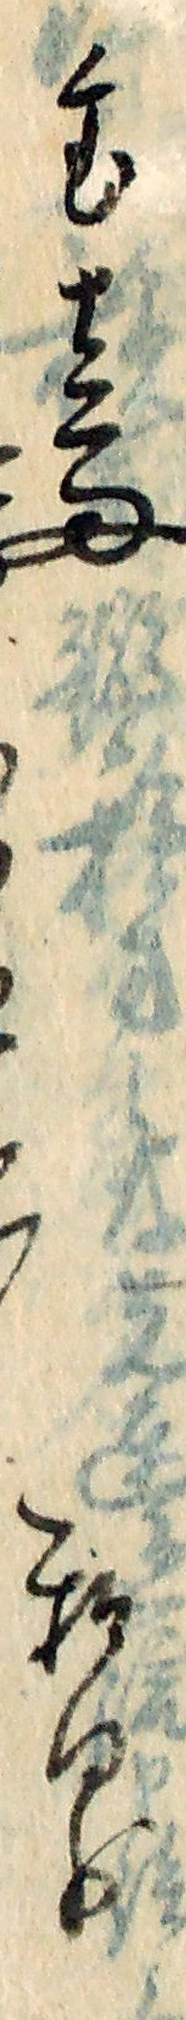一金壱両和田村
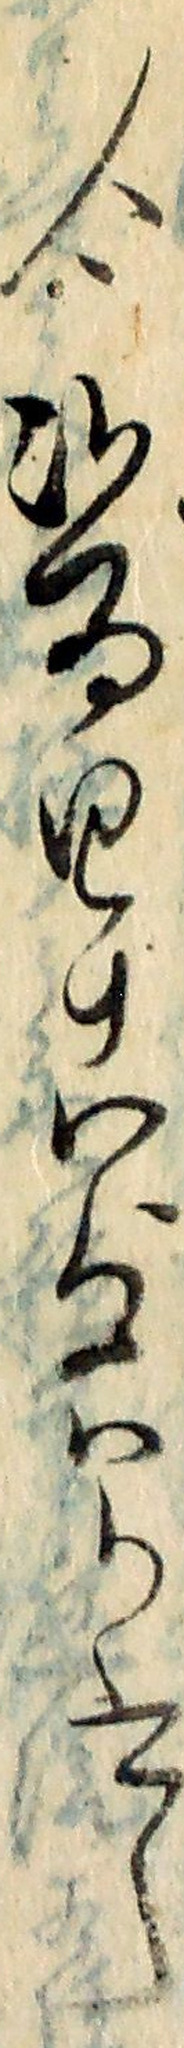〆弐百四十八匁八分六厘
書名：諸御願書控(後藤氏壱番）
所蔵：鳴門教育大学 Naruto University of Education
